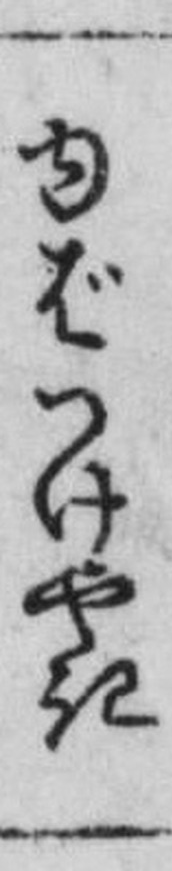ゆばつけやき
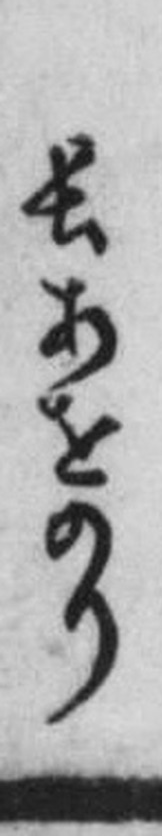長あをのり
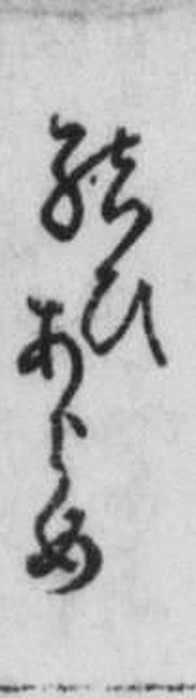あらめ
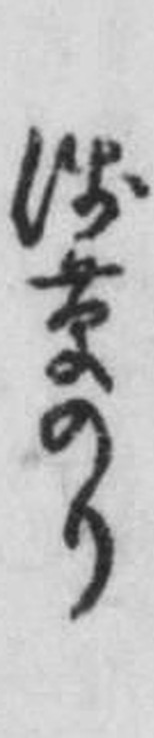浅草のり
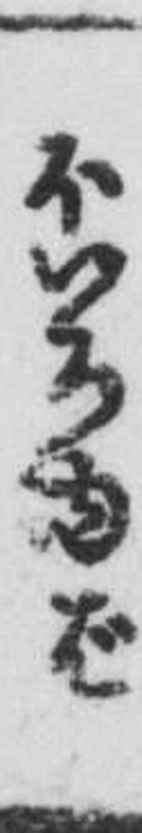ほいろゆば
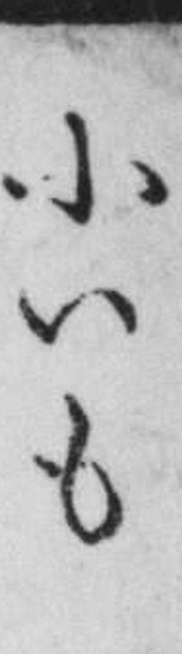小いも
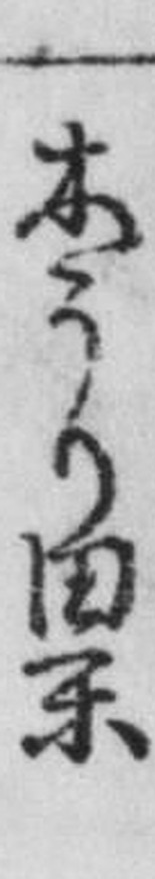木うり田楽
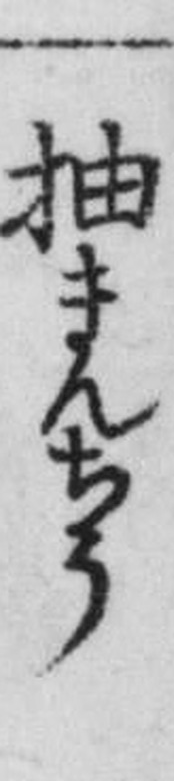柚まんちう
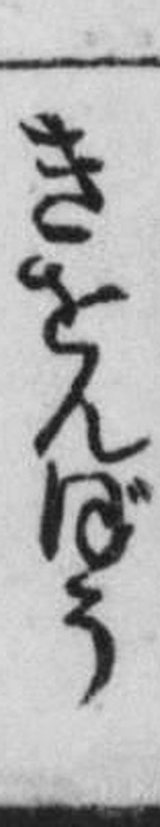きをんぼう
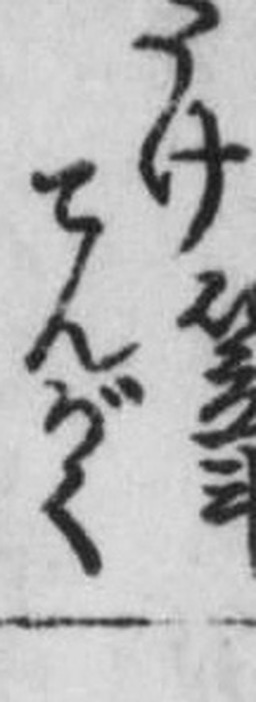てんがく
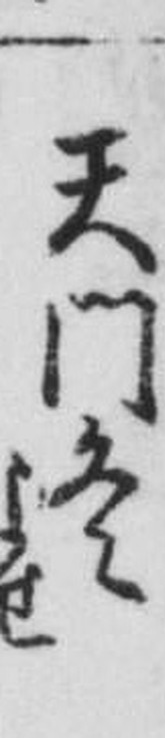天門冬
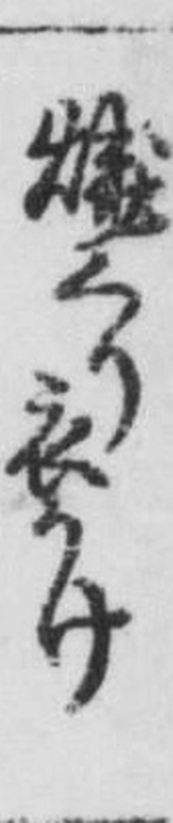焼くり衣かけ
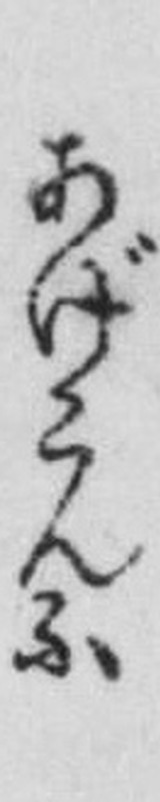あげこんふ
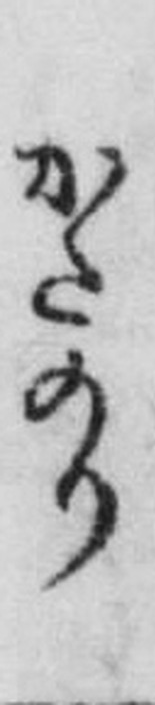かたのり
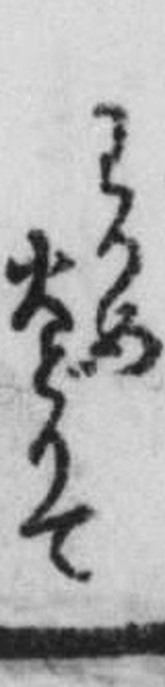火どりて
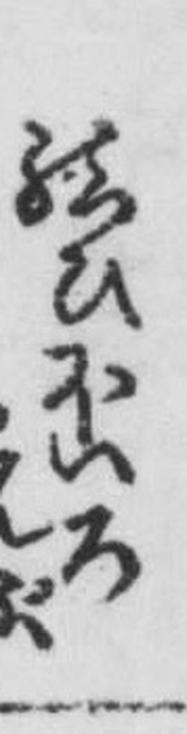結ひほいろ
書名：精進魚類間合料理/早速庖丁
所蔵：大阪府立大学学術情報センター 国文学研究資料館
